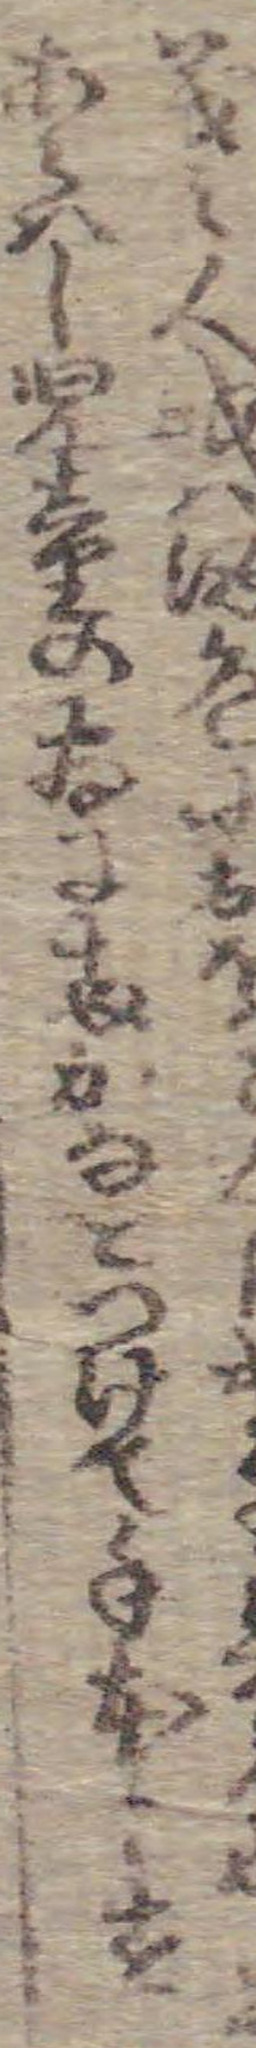あらはし児童の為に両かなをつけて手本とす
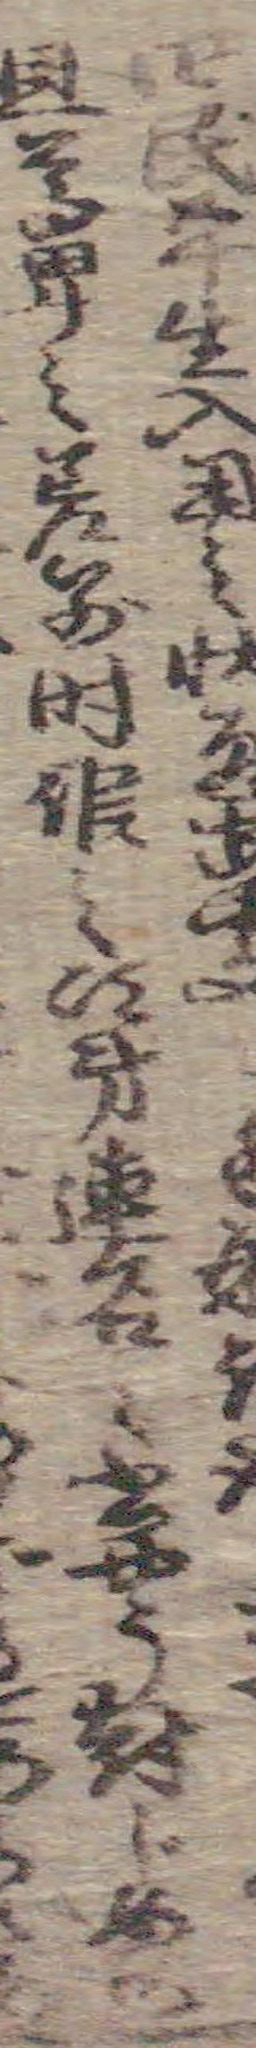且尊卑の差別時候の次第連名の書やう封じめ
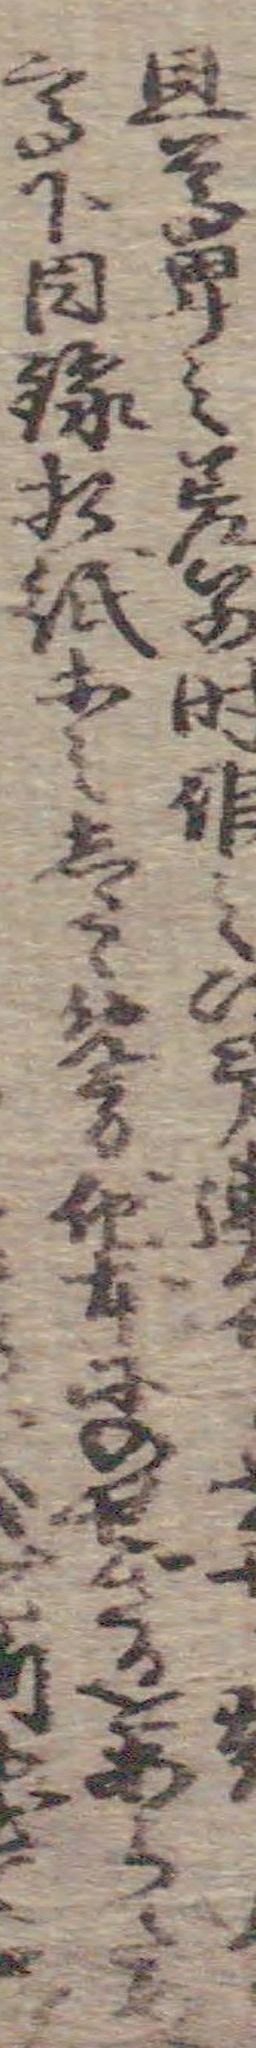高下目録折紙等のしたゝめ方他本にのせざるをあらため
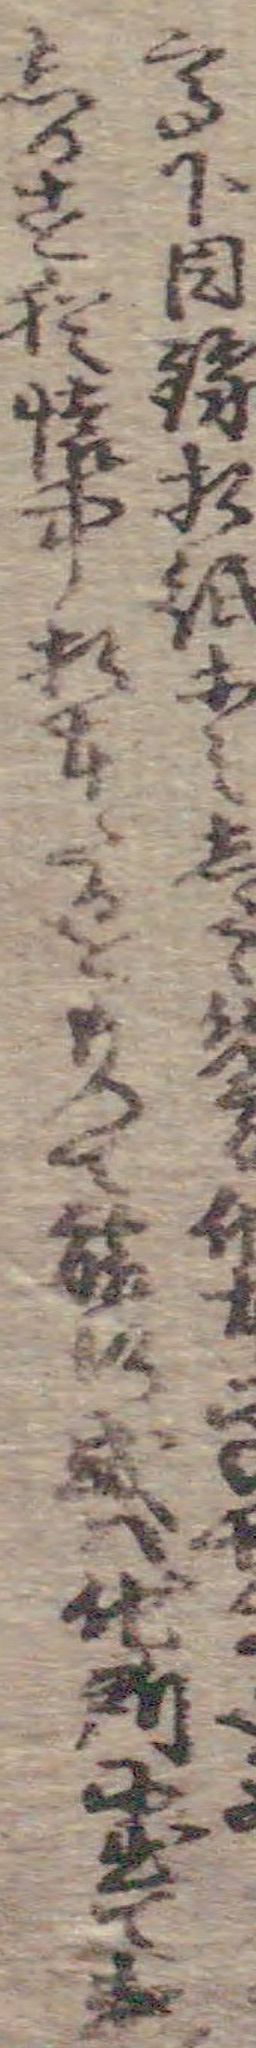しかす猶懐中折本たるをもつて旅行或は他所へ出て
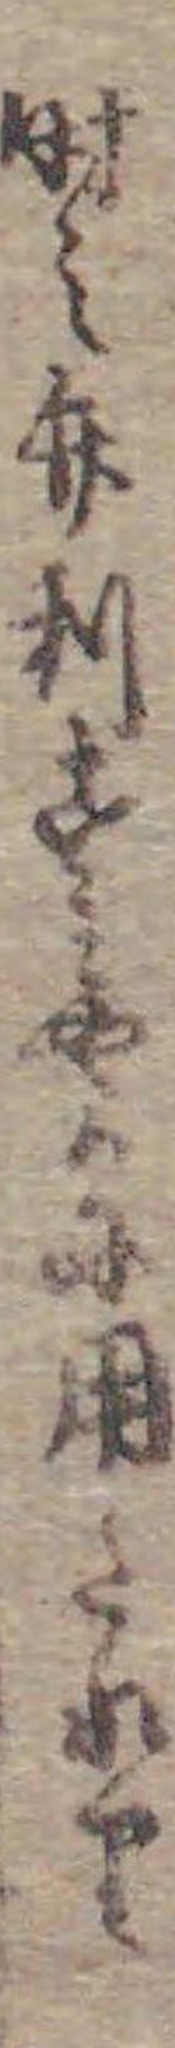時の弁利すみやかに用たれり

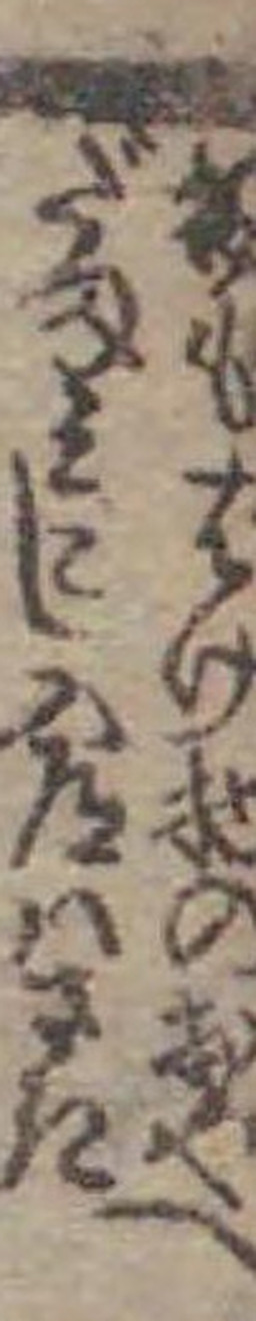だまみこし入道はさき
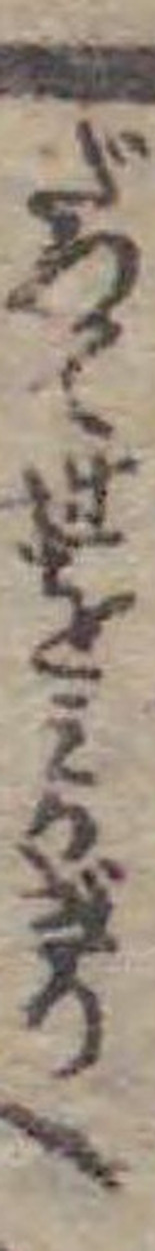だつて世をみかぎり
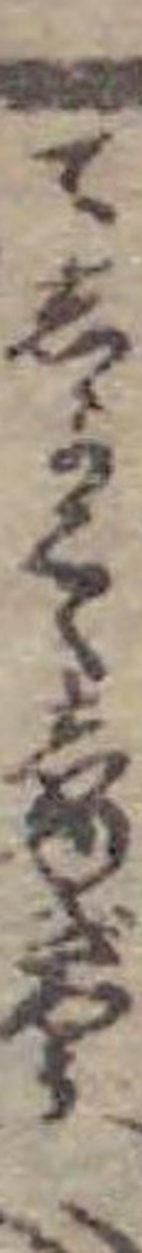てしよこくしゆぎやう
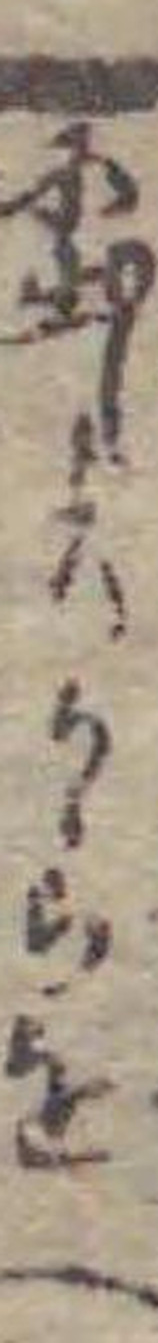に出しよりかしらを
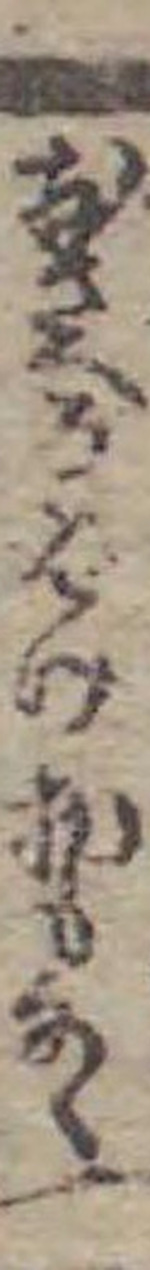おさへるばけ物もなく
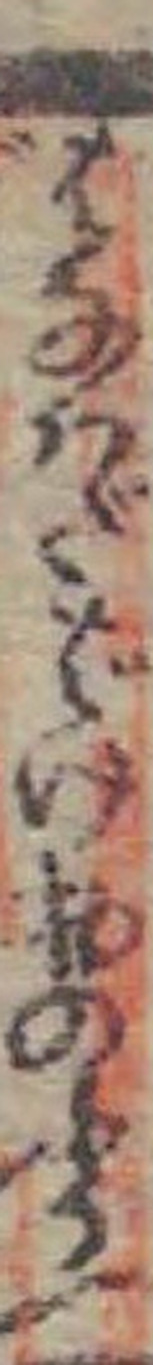はなはだばけ物のふう
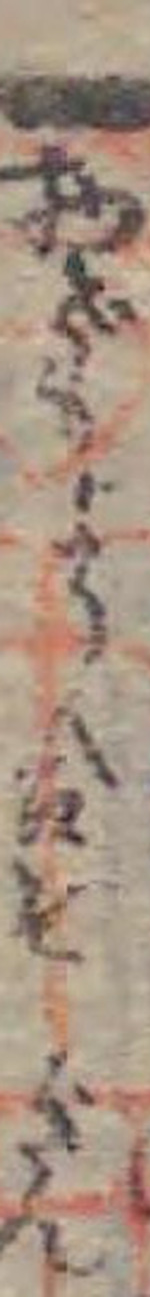物どもより合そうだん
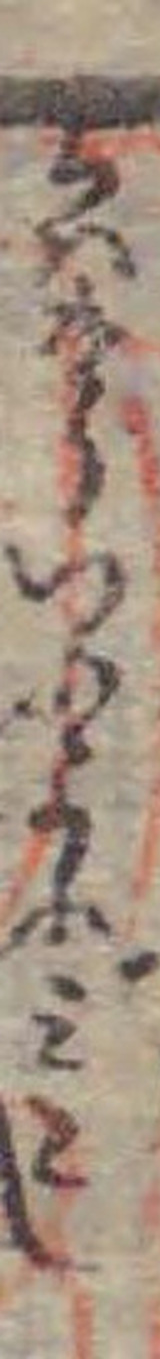かはならいふよふみこし
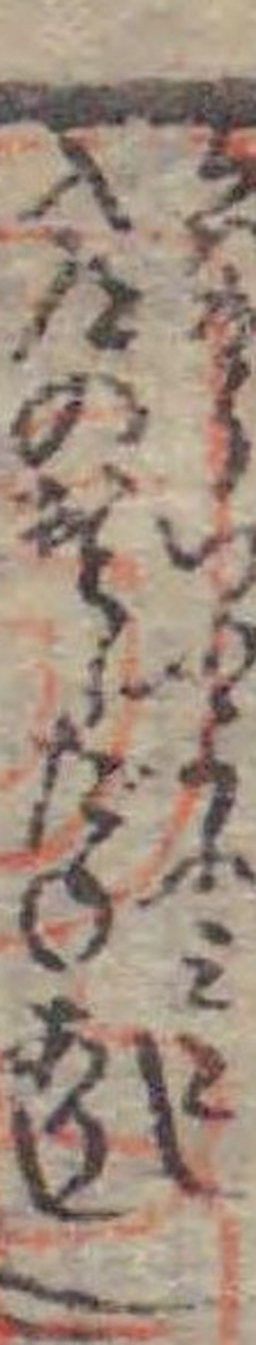入道のおとしだねありし
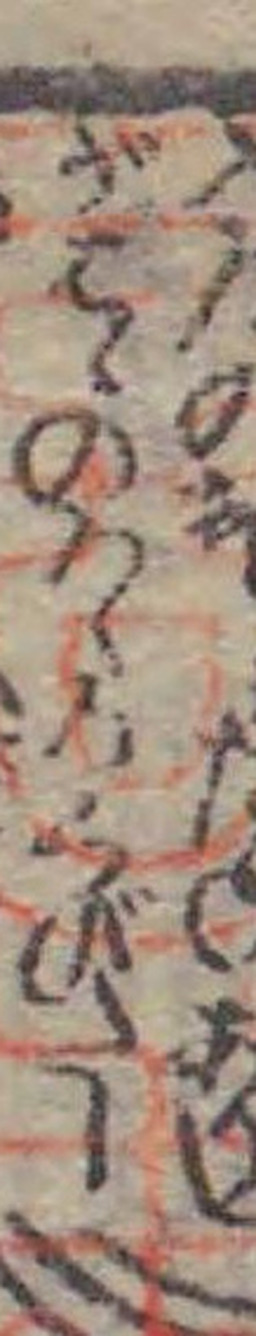がはゝのろくろくびたし
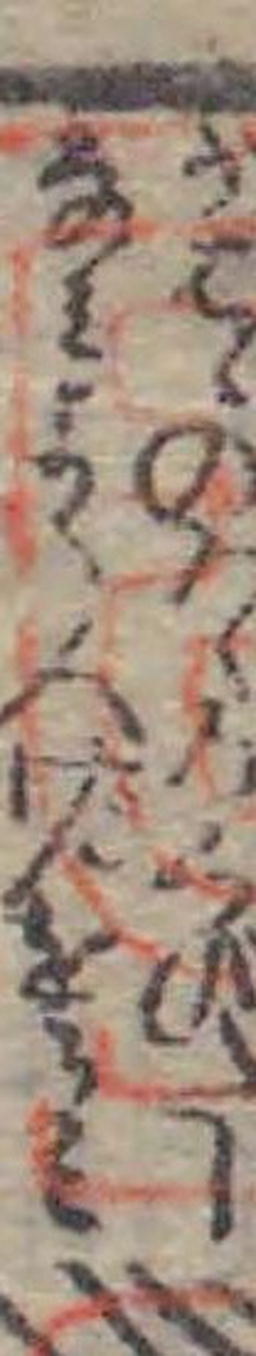なみよく人げんをうみ
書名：[化物一代記] : 5巻
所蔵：国立国会図書館 National Diet Library, JAPAN
